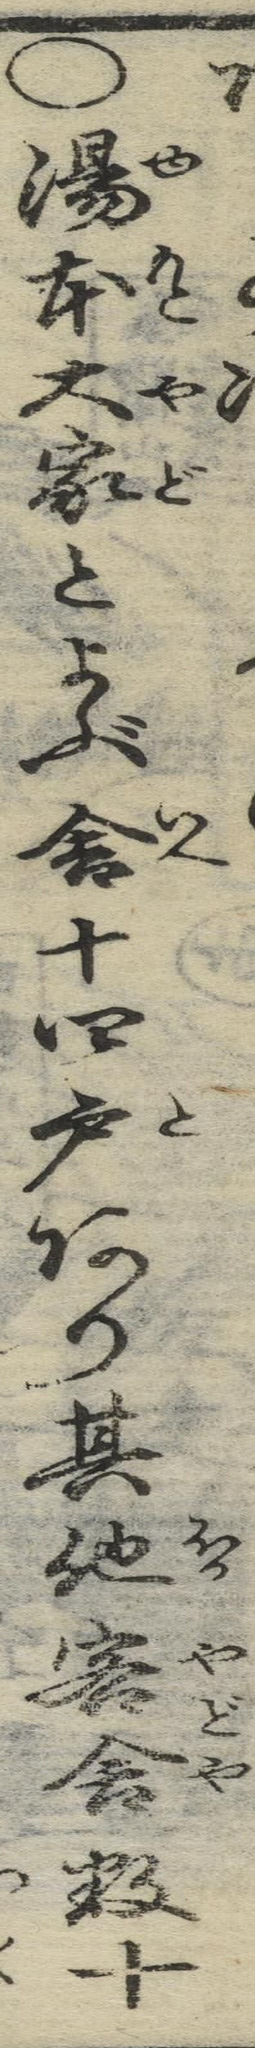○湯本大家とよぶ舎十四戸あり其他客舎数十
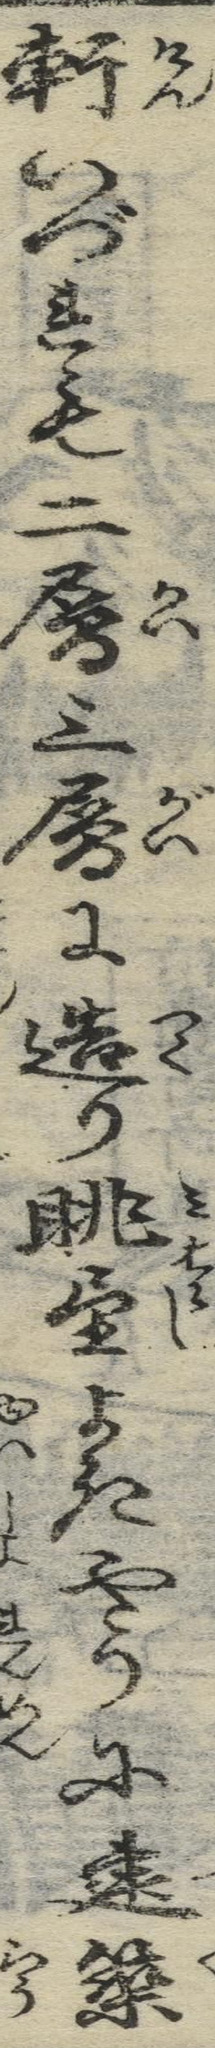軒いづれも二層三層に造り眺望よきやうに建築
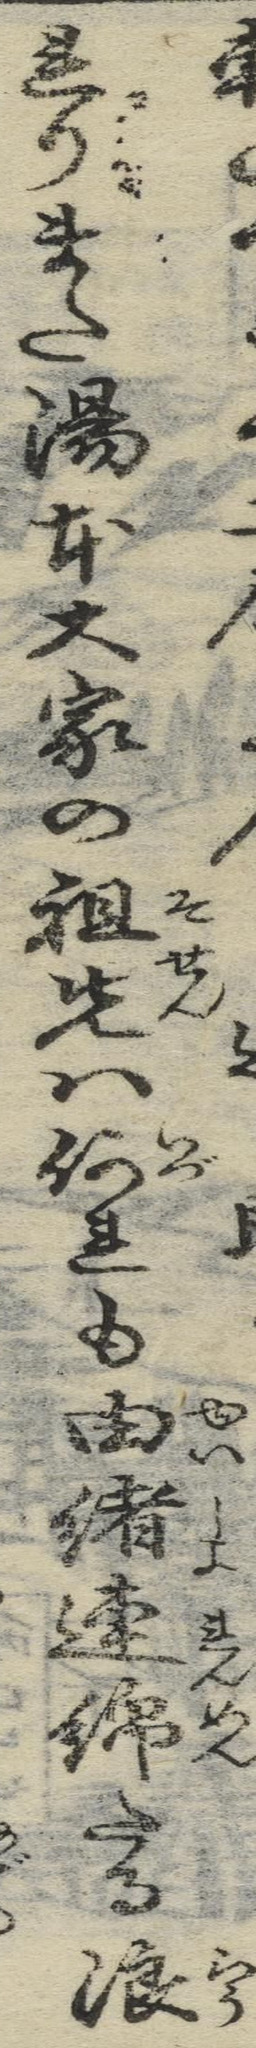れりまた湯本大家の祖先は何れも由緒連綿たる浪
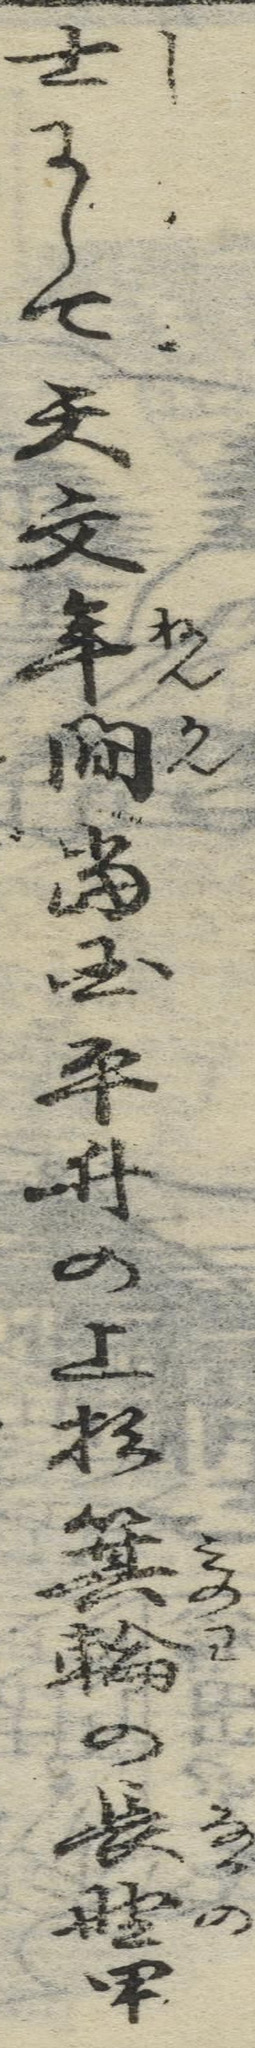士にして天文年間当国平井の上杉箕輪の長野甲
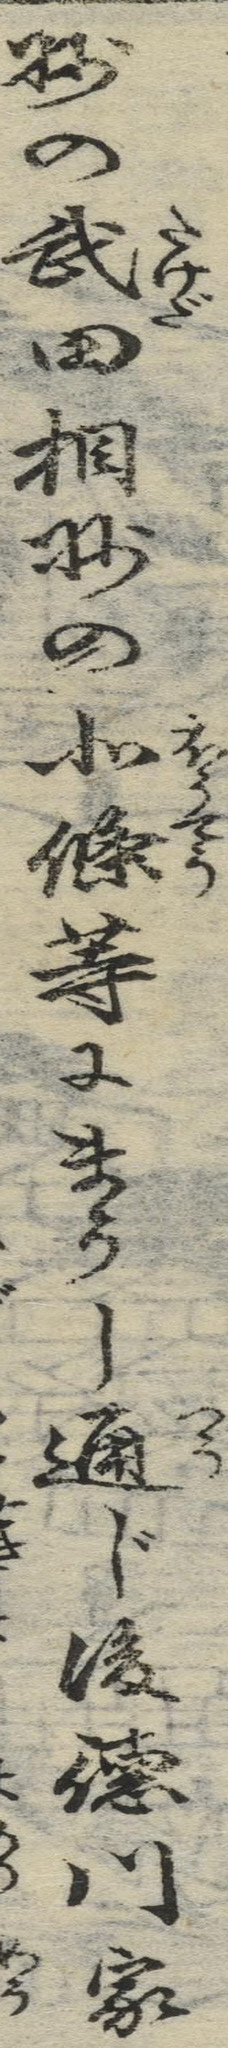州の武田相州の北條等にまうし通じ後徳川家
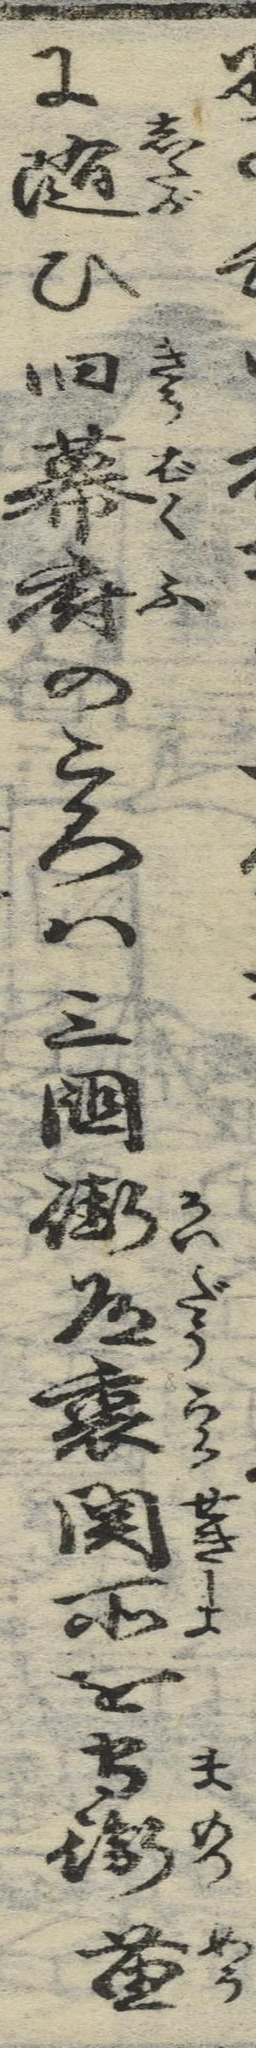に随ひ旧幕府のころは三国街道裏関所を守衛苗
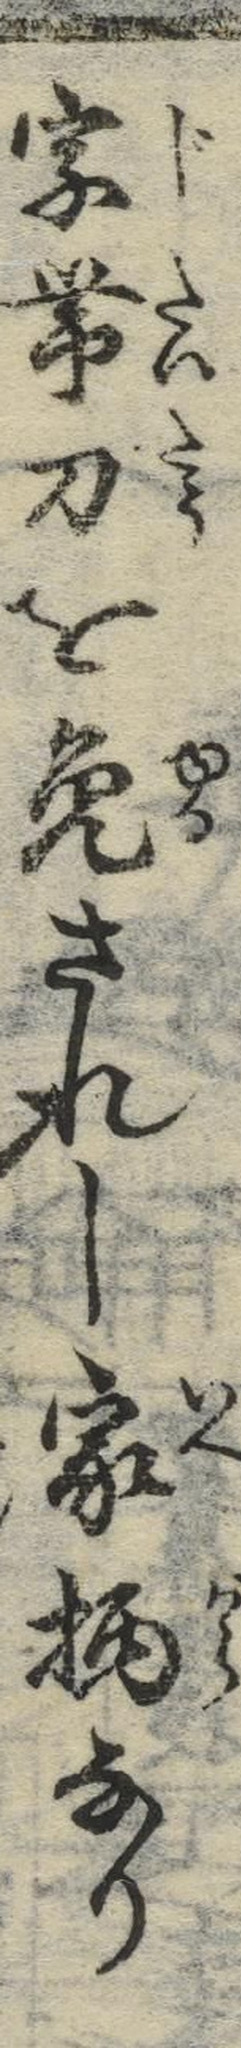字帯刀を免されし家柄なり
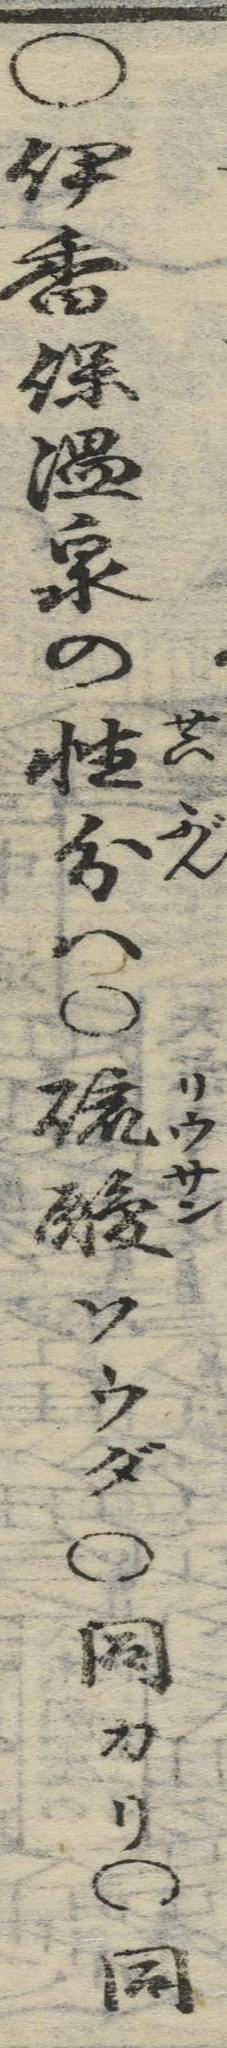○伊香保温泉の性分は○硫酸ソウダ○同カリ○同
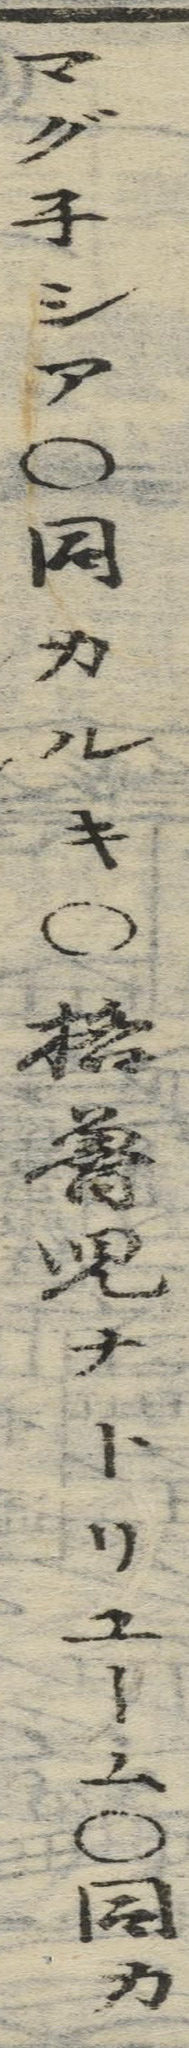マグネシア○同カルキ○格魯児ナトリユーム○同カ
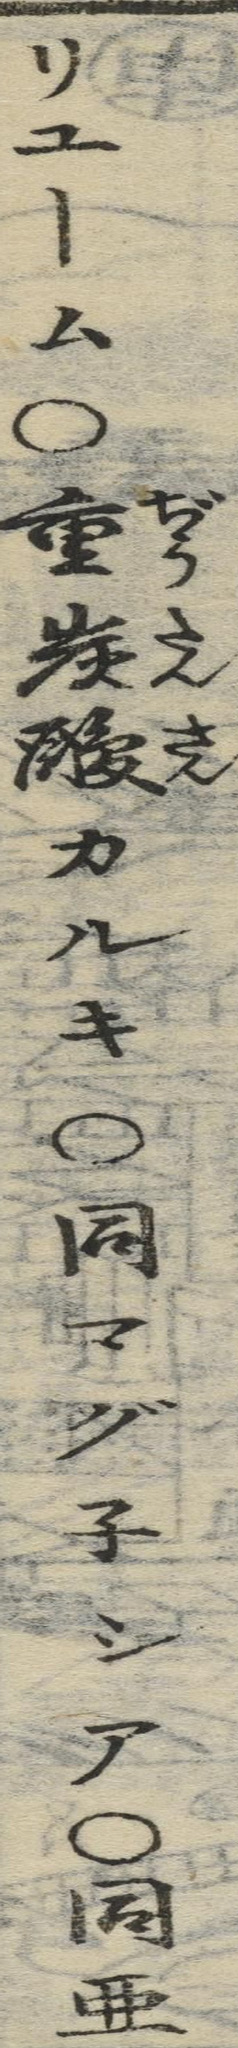リユーム○重炭酸カルキ○同マグネシア○同亜
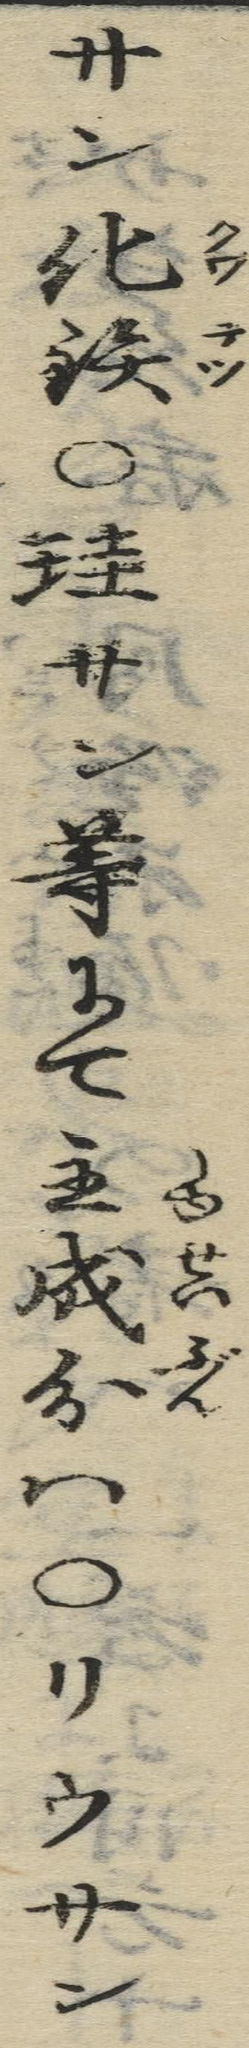サン化鉄○珪サン等にて主成分は○リウサン
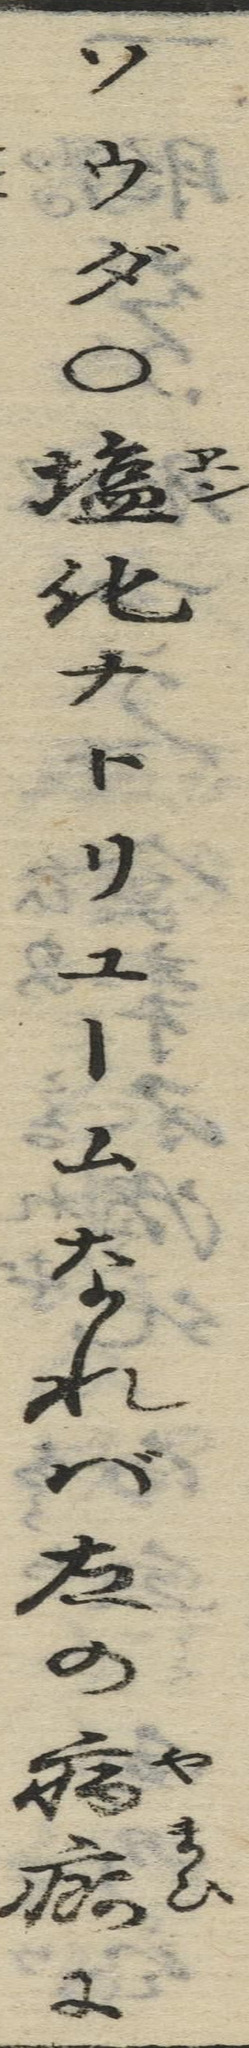ソウダ○塩化ナトリユームなれば左の病痾に
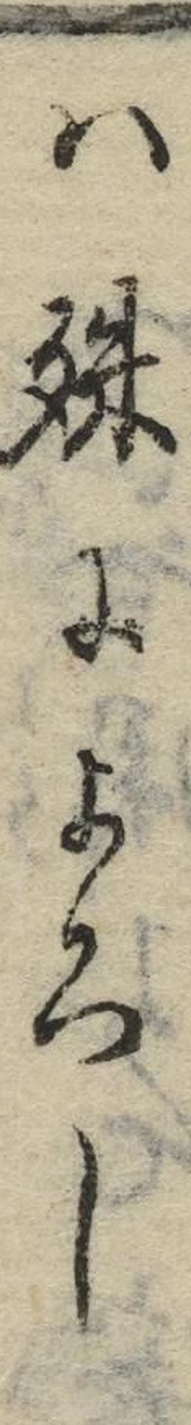は殊によろし
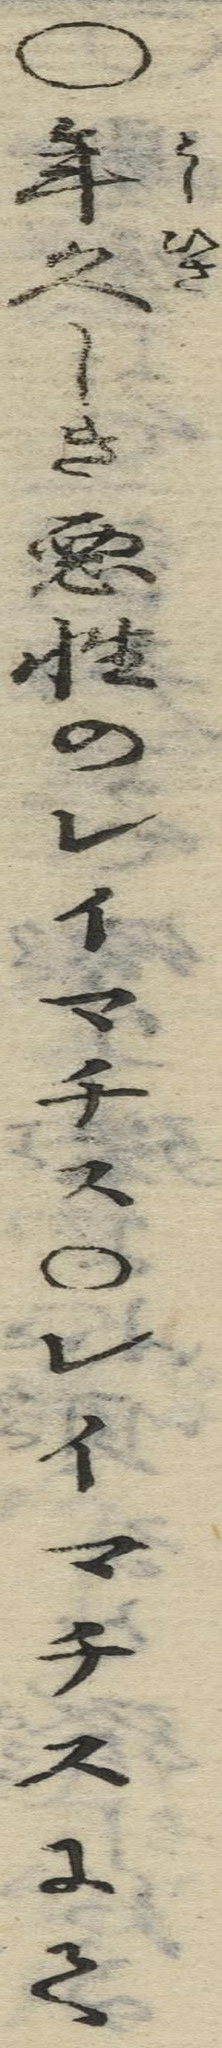○年久しき悪性のレイマチス○レイマチスにて
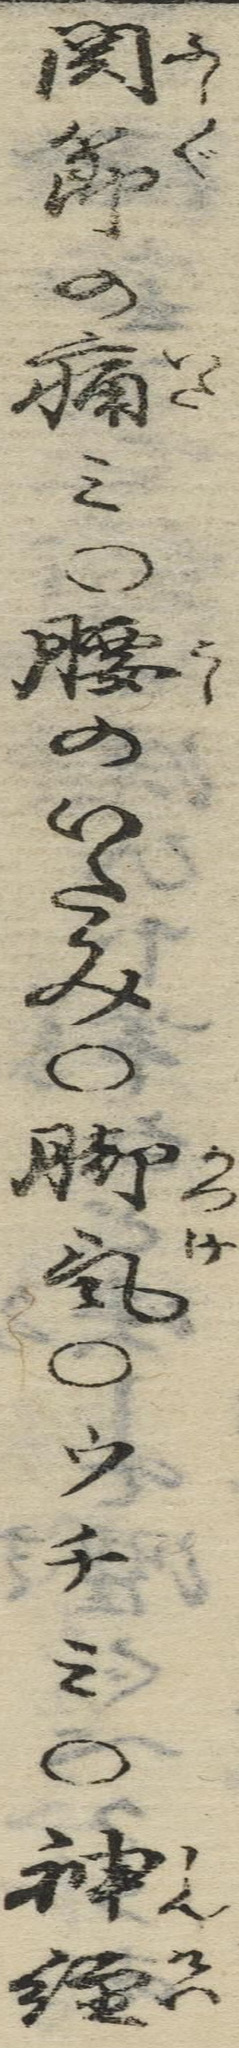関節の痛み○腰のいたみ○脚気○ウチミ○神経
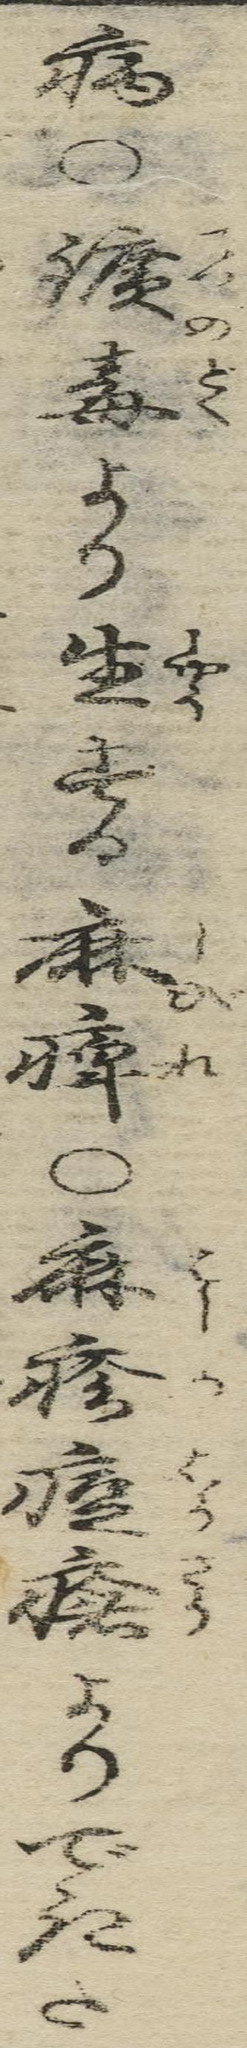病○鑛毒より生する麻痺○麻疹疱瘡よりできた
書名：上州伊香保鑛泉圖會　全
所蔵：東京大学地震研究所図書室 Earthquake Research Institute Library, The University of Tokyo, JAPAN
